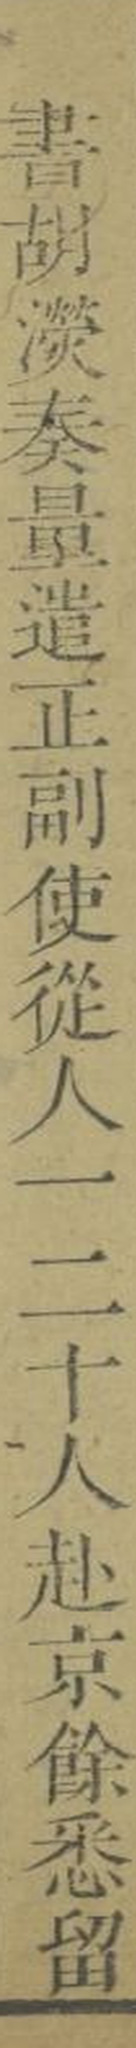書胡濙奏量遣正副使従人一二十人赴京余悉留
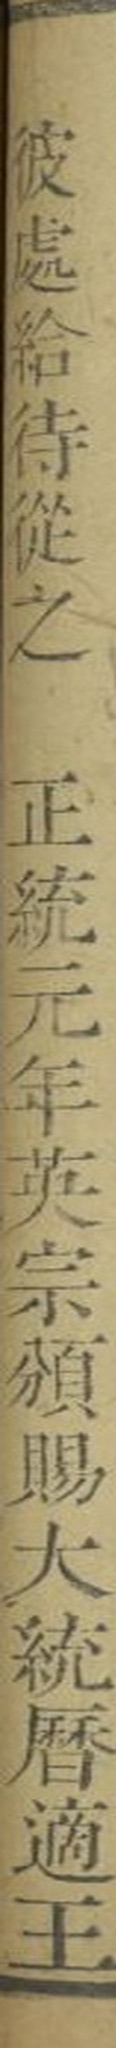彼処給待従之正統元年英宗頒賜大統暦適王
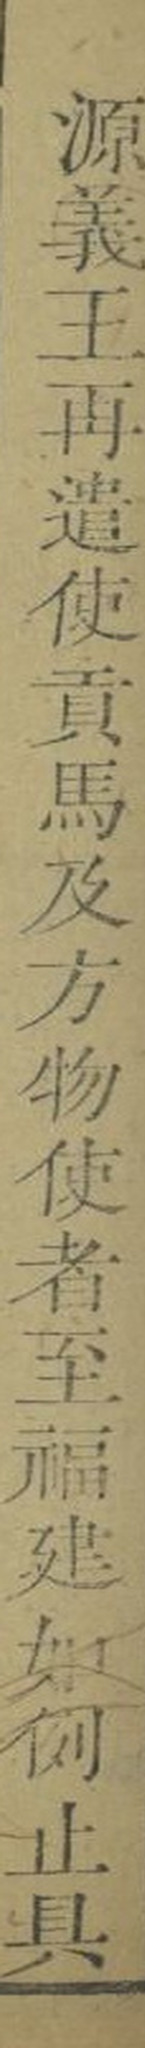源義王再遣使貢馬及方物使者至福建如例止具
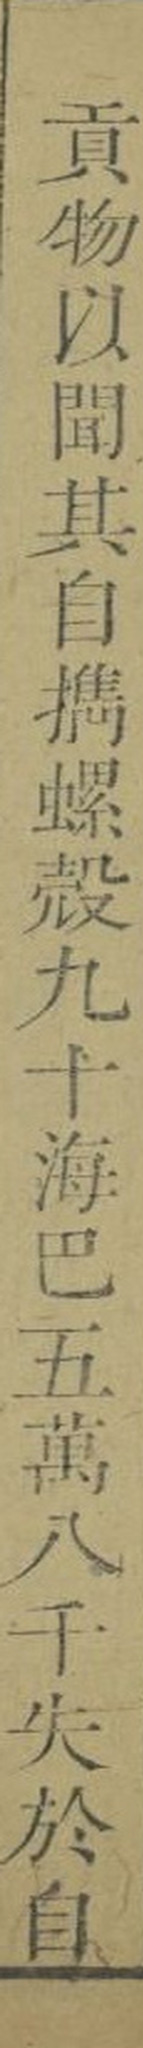貢物以聞其自携螺殻九十海巴五万八千失於自
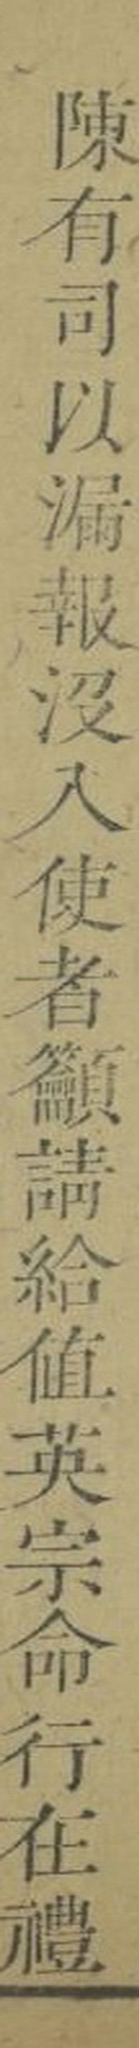陳有司以漏報没入使者籲請給値英宗命行在礼
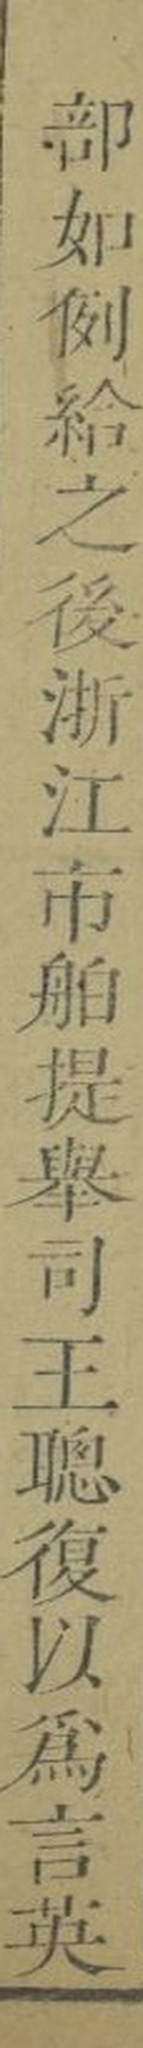部如例給之後浙江市舶提挙司王聡復以為言英
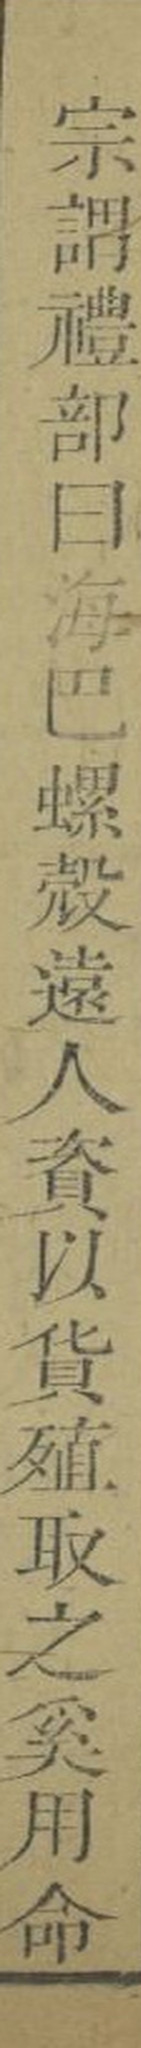宗謂礼部曰海巴螺殻遠人資以貨殖取之奚用命
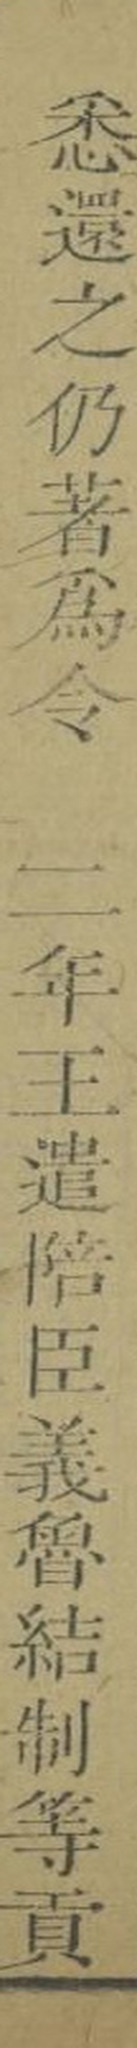悉還之仍著為令二年王遣陪臣義魯結制等貢
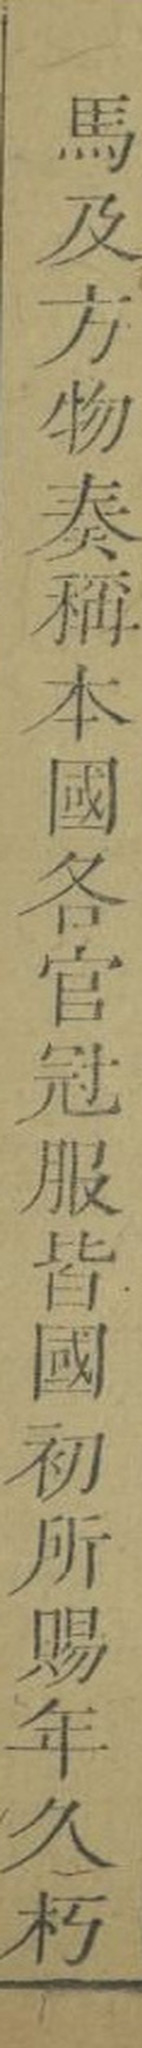馬及方物奏称本国各官冠服皆国初所賜年久朽
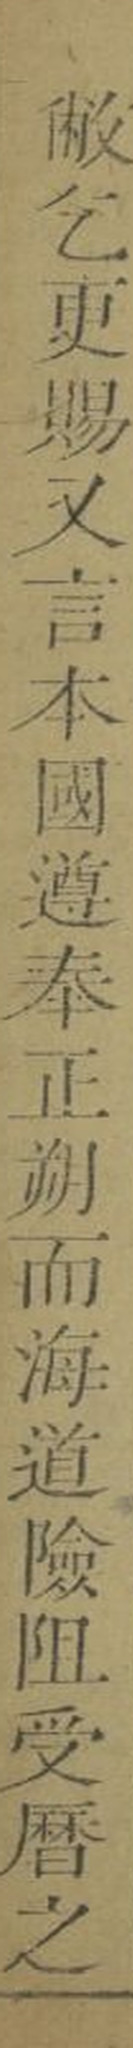敝乞更賜又言本国遵奉正朔而海道険阻受暦之

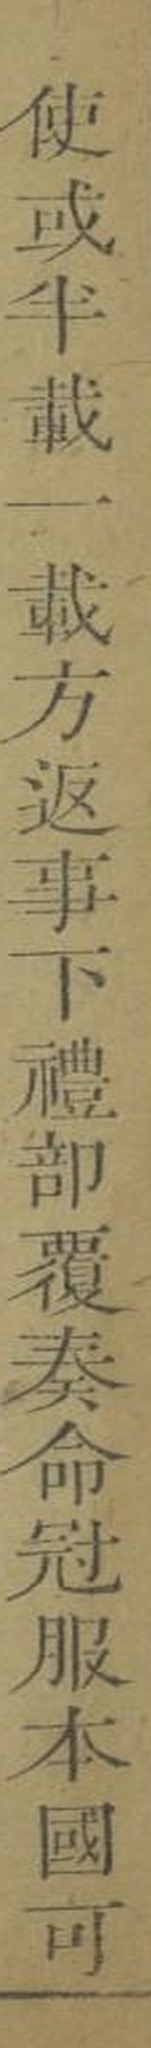使或半載一載方返事下礼部覆奏命冠服本国可
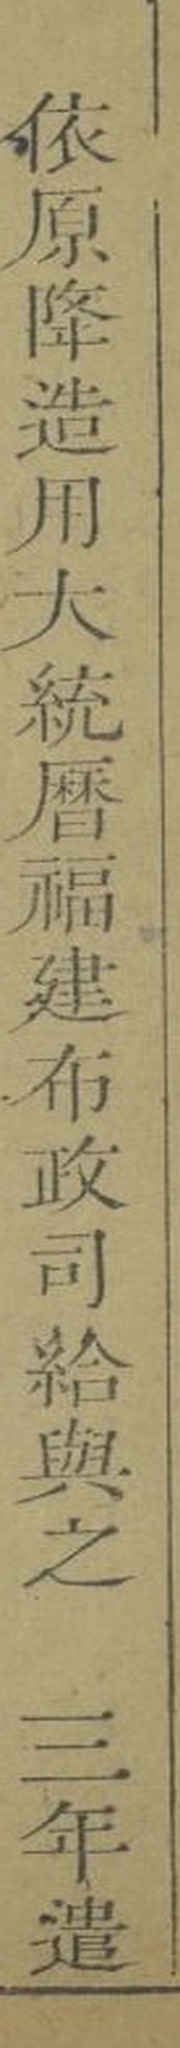依原降造用大統暦福建布政司給与之三年遣
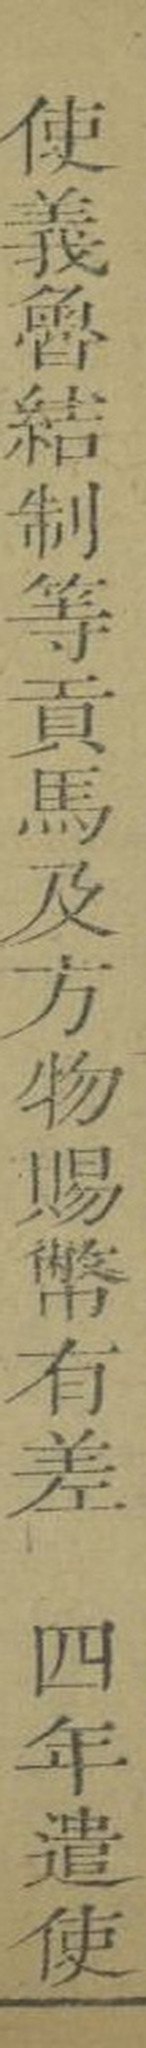使義魯結制等貢馬及方物賜幣有差四年遣使
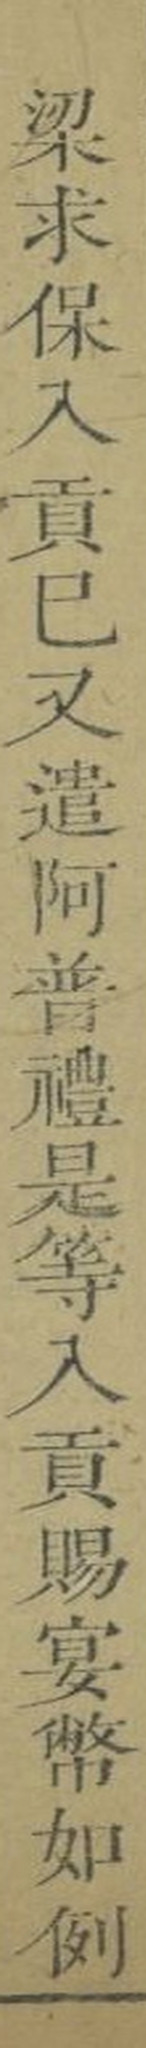梁求保入貢巳又遣阿普礼是等入貢賜宴幣如例
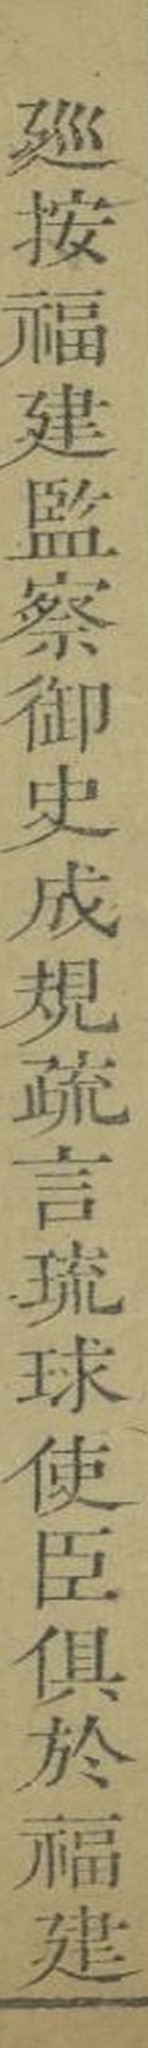巡按福建監察御史成規疏言琉球使臣俱於福建
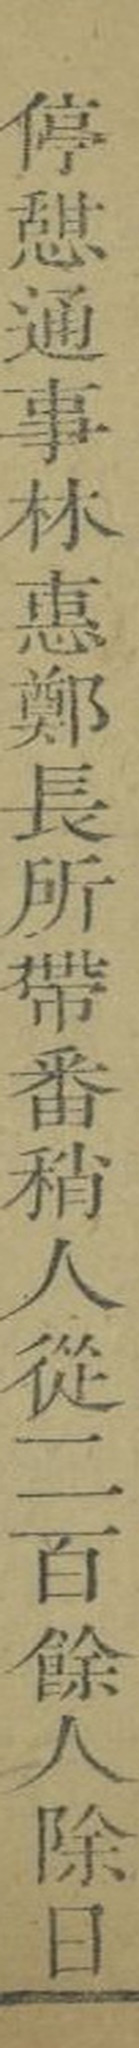停憩通事林恵鄭長所帯番稍人従二百余人除日
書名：中山伝信録 巻三
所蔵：University of the Ryukyus Library
